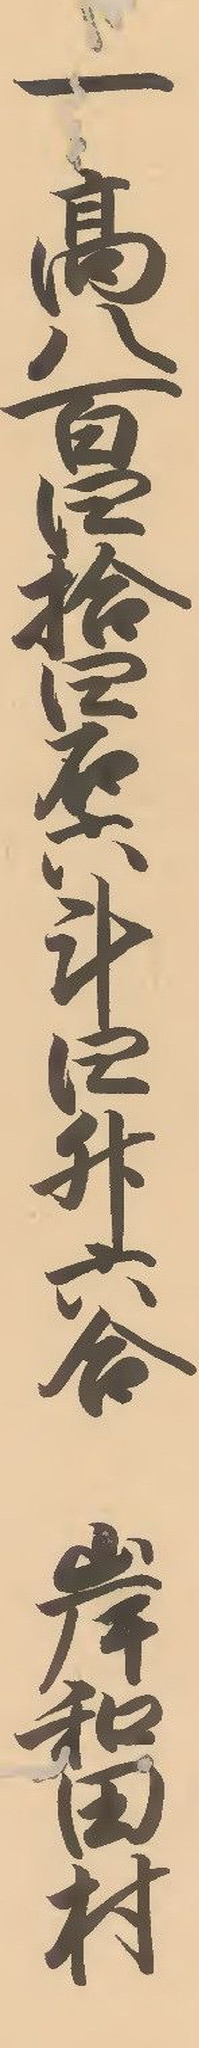一高八百四拾四石六斗四升六合岸和田村
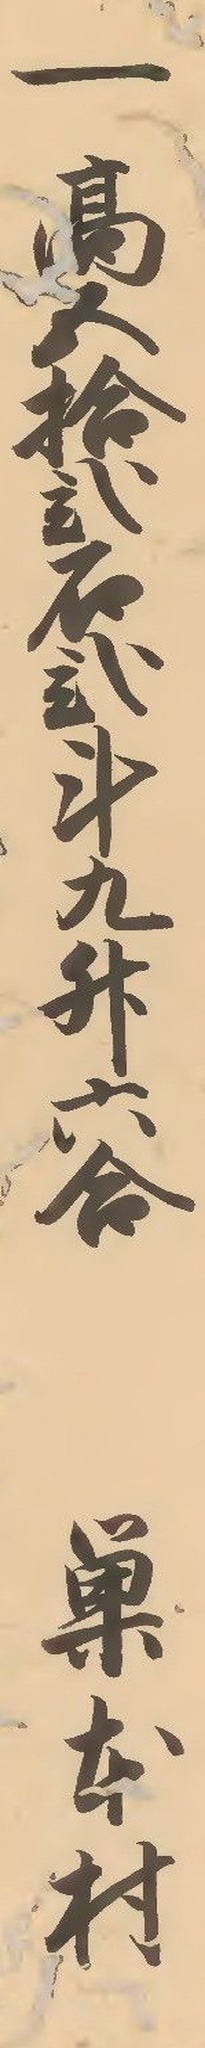一高五拾弐石弐斗九升六合巣本村

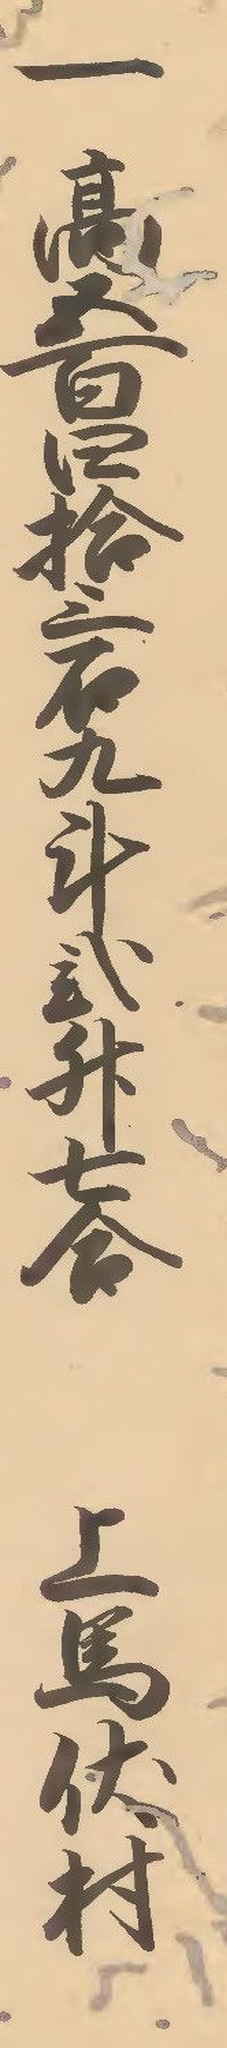一高五百四拾三石九斗弐升七合上馬伏村
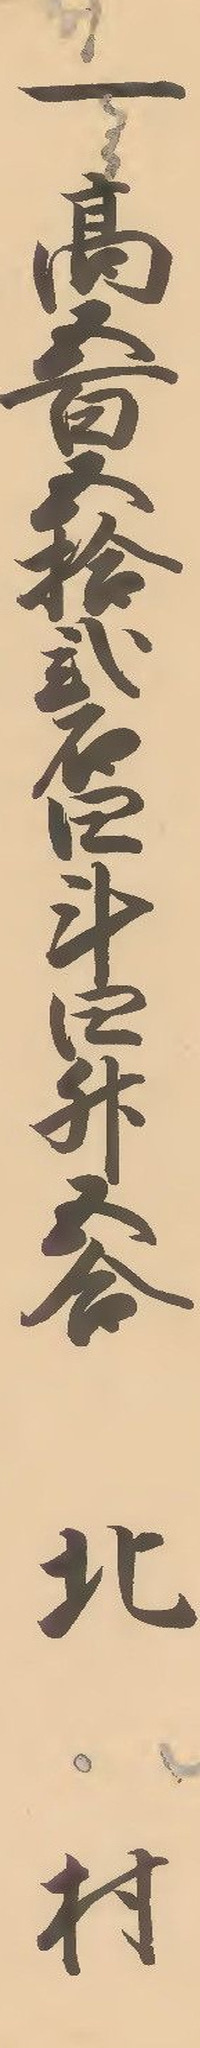一高五百五拾弐石四斗四升五合北村
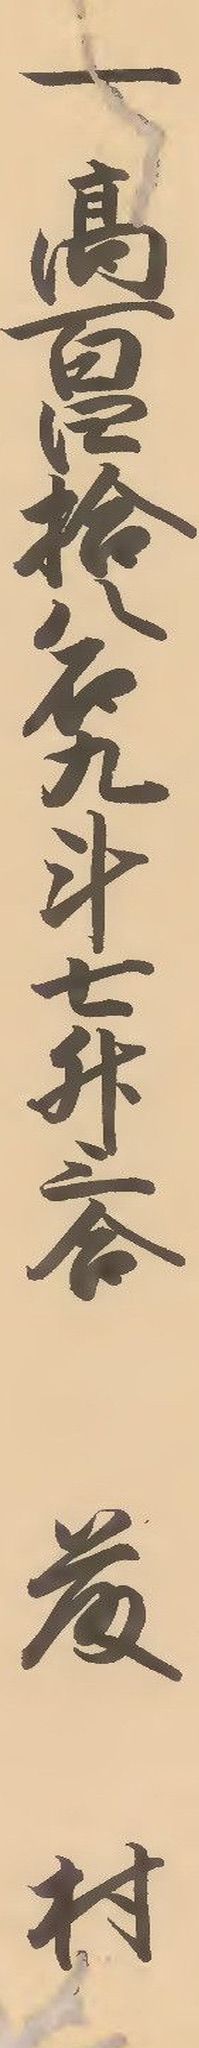一高百四拾八石九斗七升三合藤村
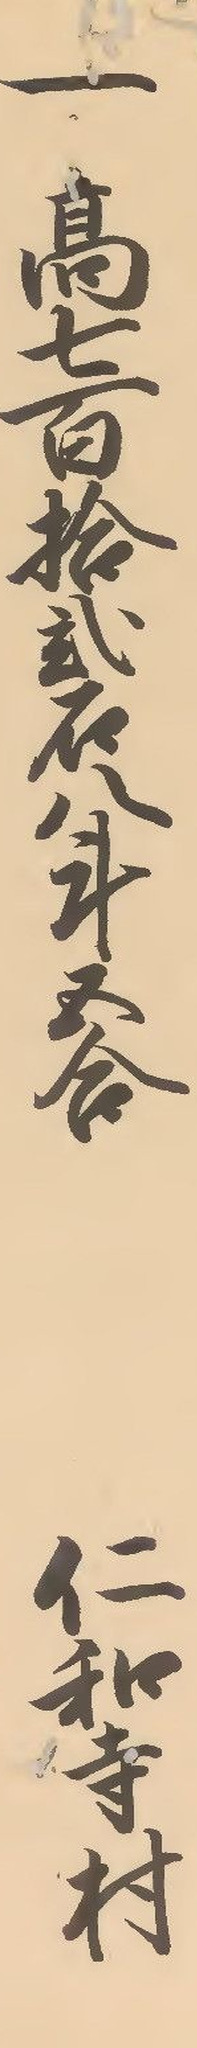一高七百拾弐石八斗五合仁和寺村
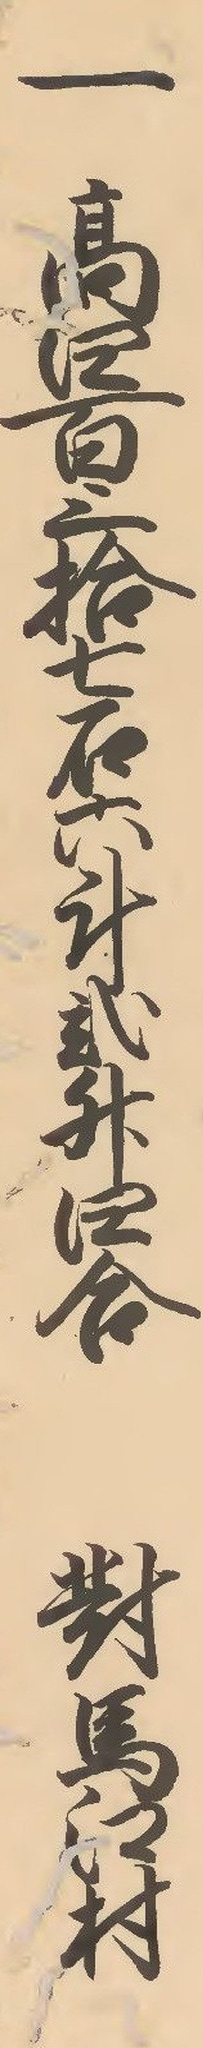一高四百三拾七石六斗弐升四合対馬江村

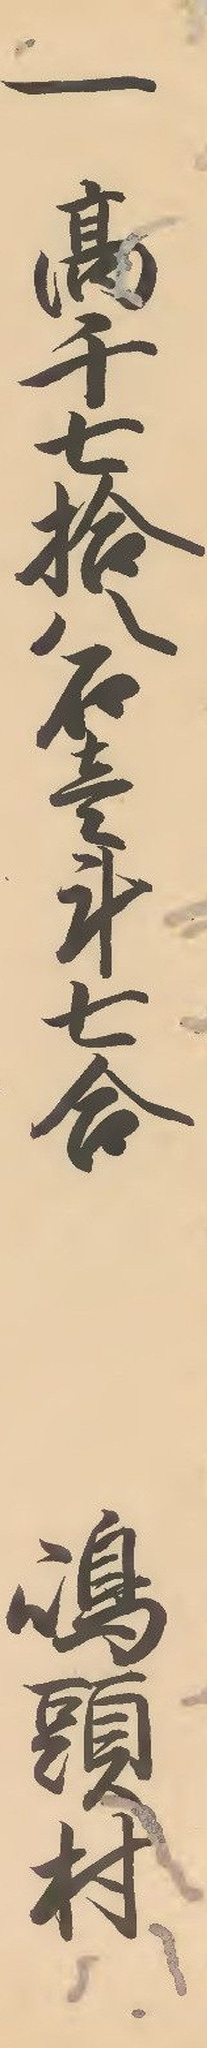一高千七拾八石壱斗七合島頭村
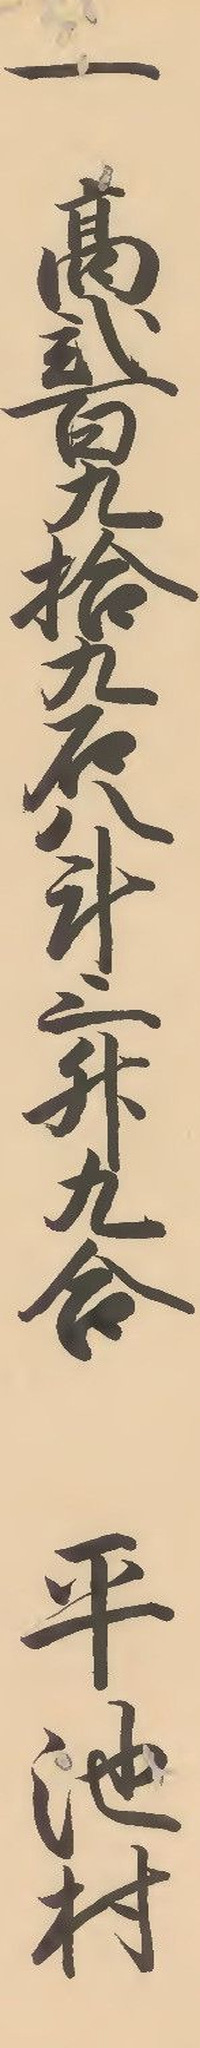一高弐百九拾九石八斗三升九合平池村
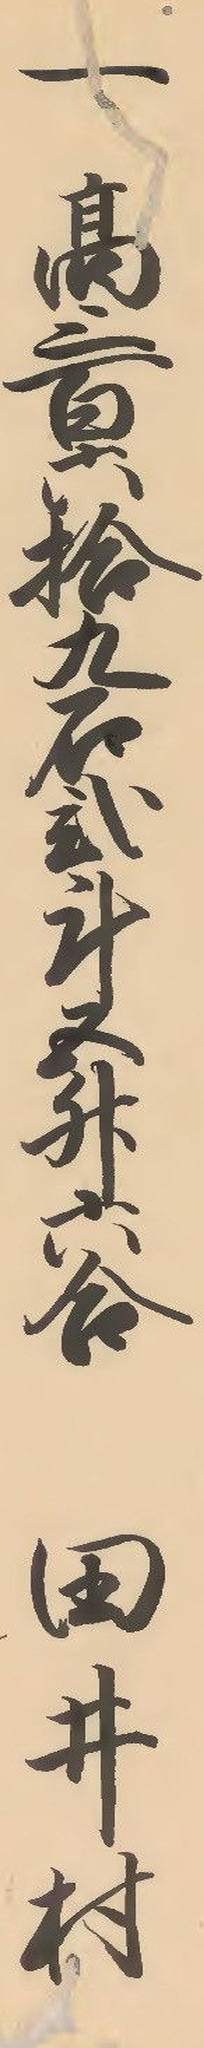一高三百六拾九石弐斗五升六合田井村
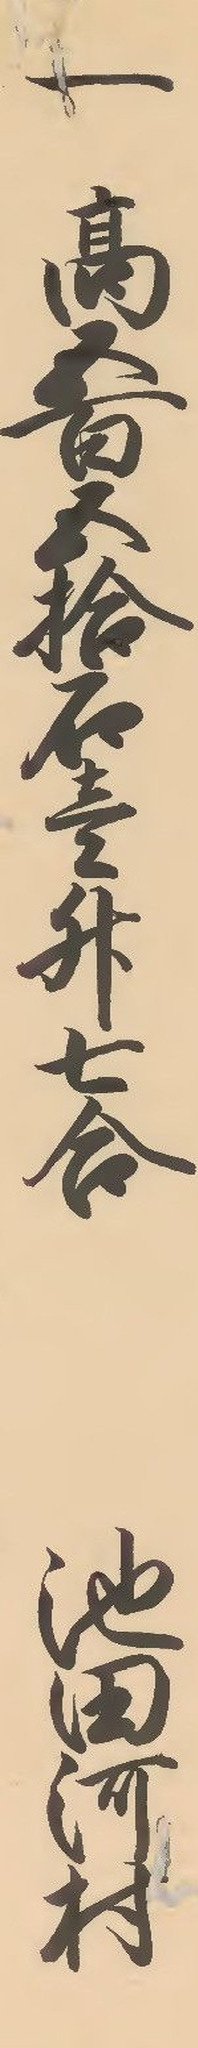一高五百五拾石壱升七合池田河村
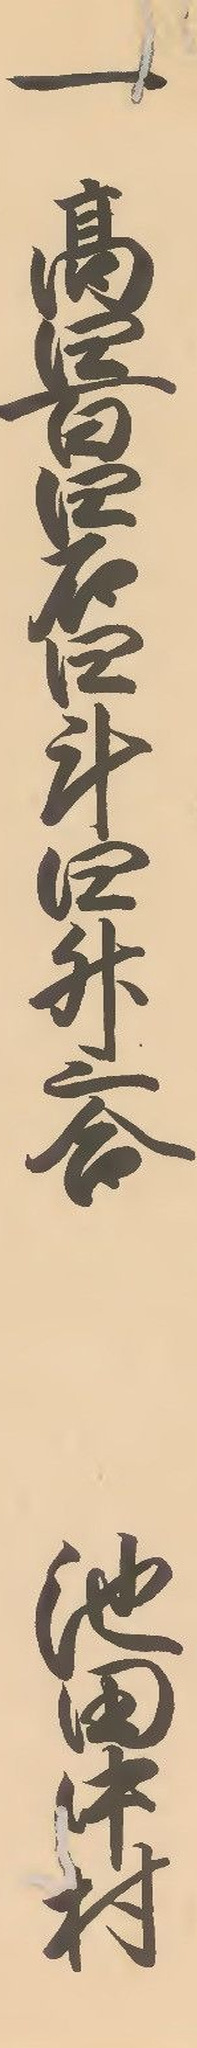一高四百四石四斗四升三合池田中村
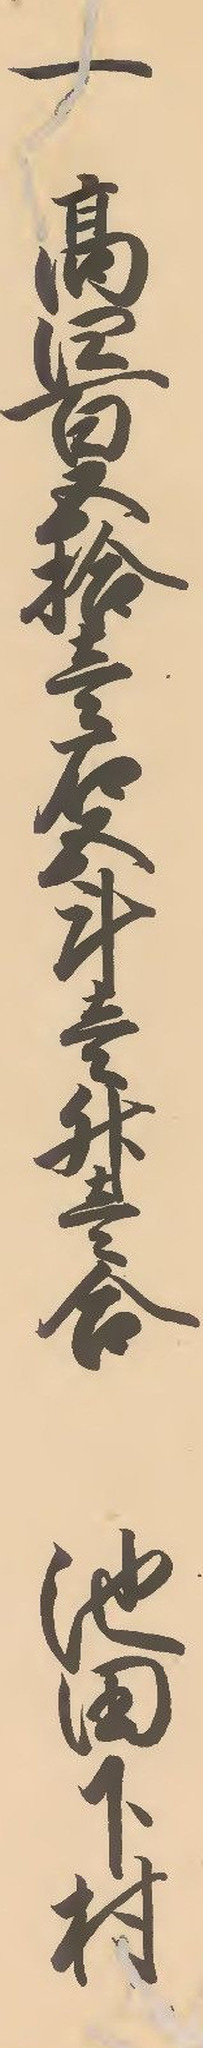一高四百五拾壱石五斗壱升壱合池田下村

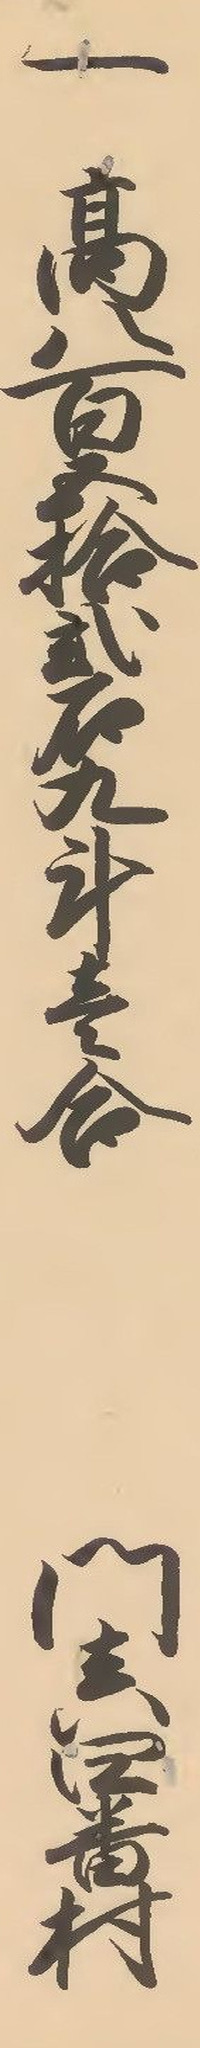一高八百五拾弐石九斗壱合門真四番村
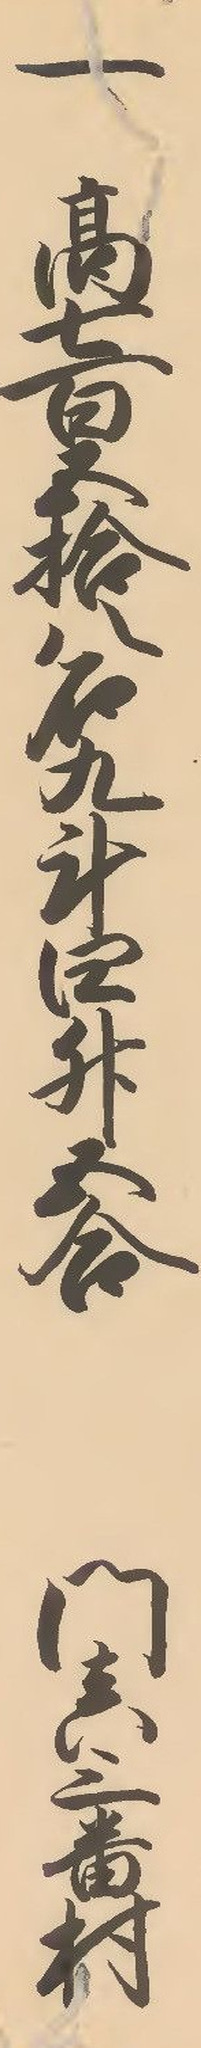一高七百五拾八石九斗四升五合門真三番村
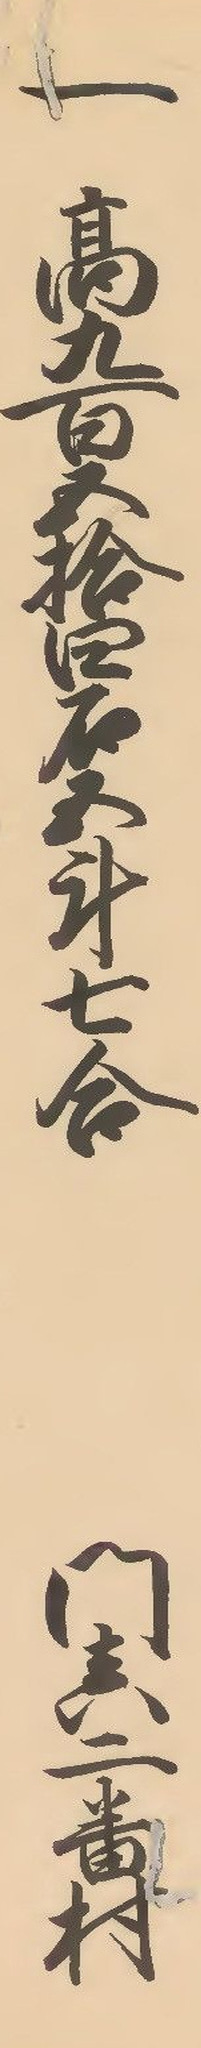一高九百五拾四石五斗七合門真二番村
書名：河内国郷帳
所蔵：国立公文書館 National Archives of Japan
